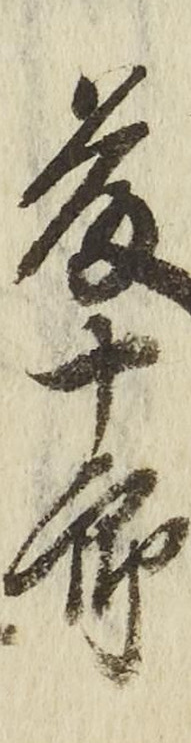藤十郎
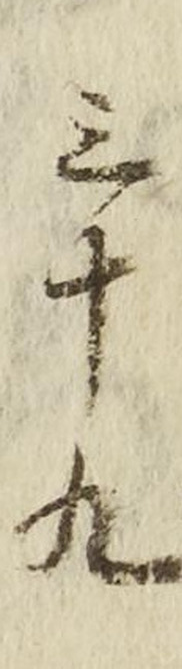三十九

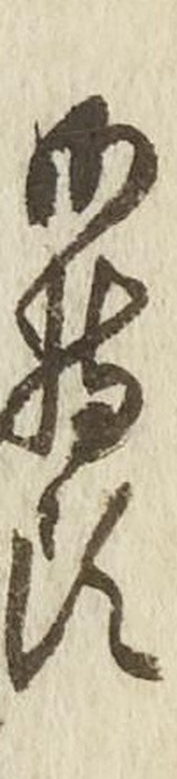御持頭
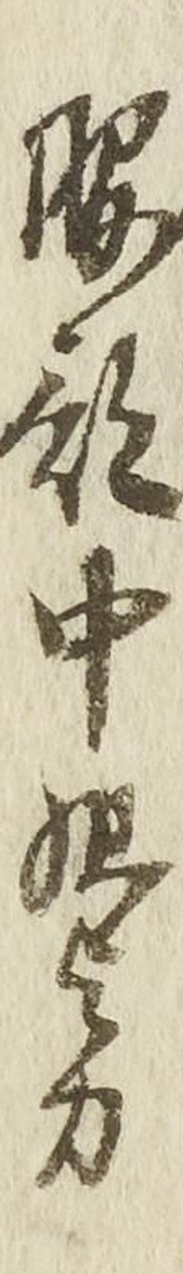服部中組与力
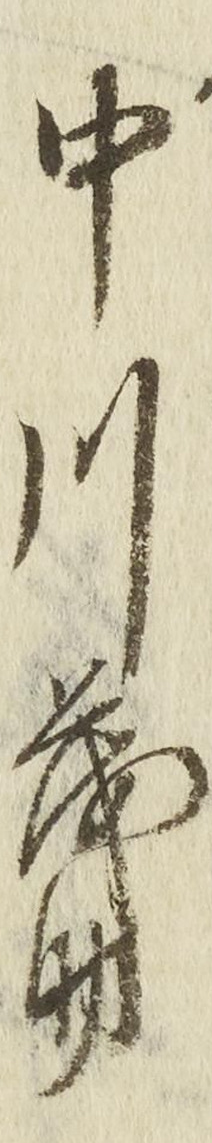中川茂助
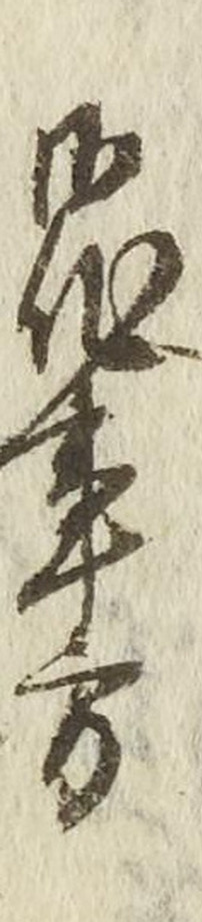御作事方
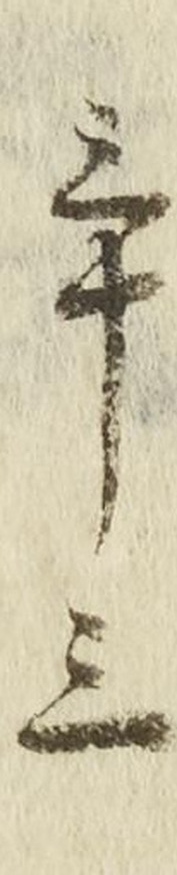三十二
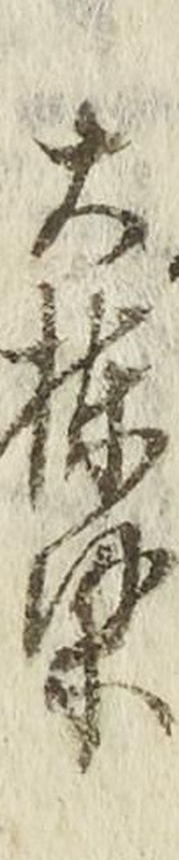大棟梁
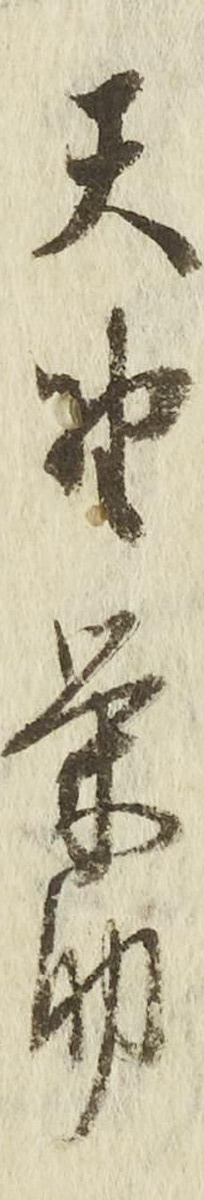天野栄助
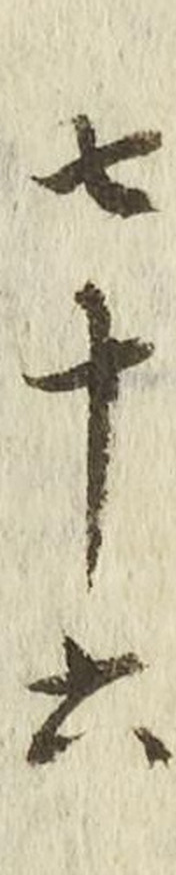七十六
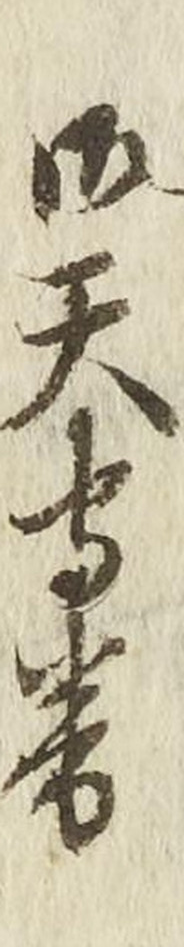御天守番
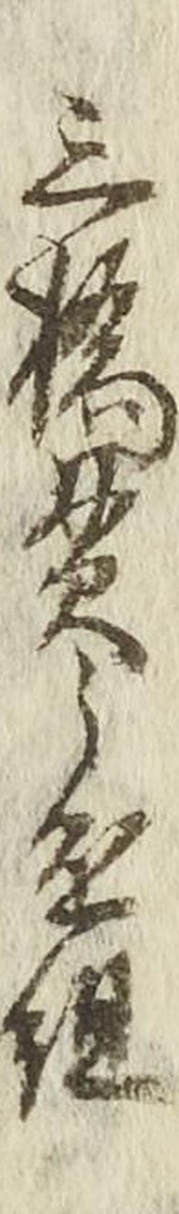三橋貫之進組
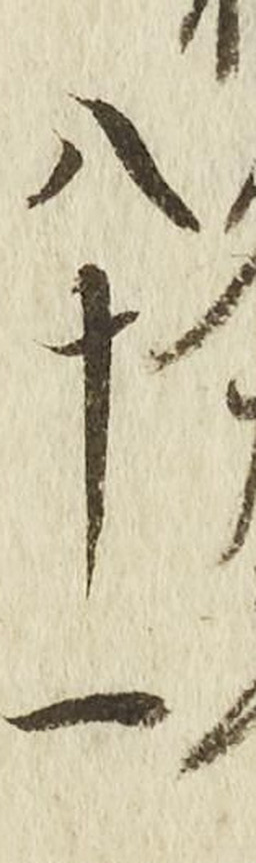八十一
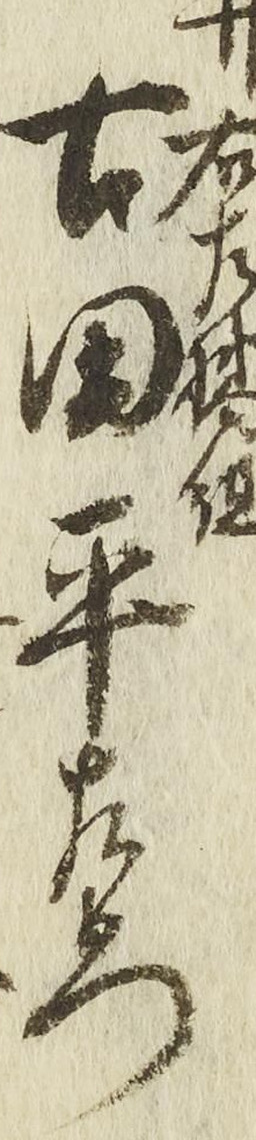古田平左衛門
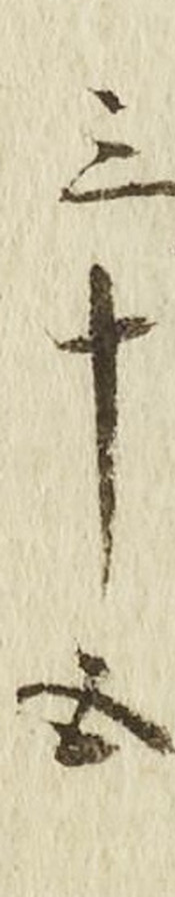三十五
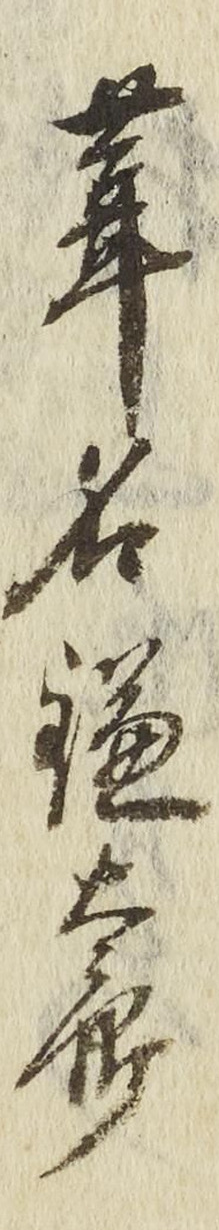葦名鎌太郎
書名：世説ヤンレフシ写、駿州田中城地震ニ付内外破損御届書、豫州大洲城地震ニ付内外破損御届書・封廻状
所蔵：東京大学地震研究所図書室 Earthquake Research Institute Library, The University of Tokyo, JAPAN
